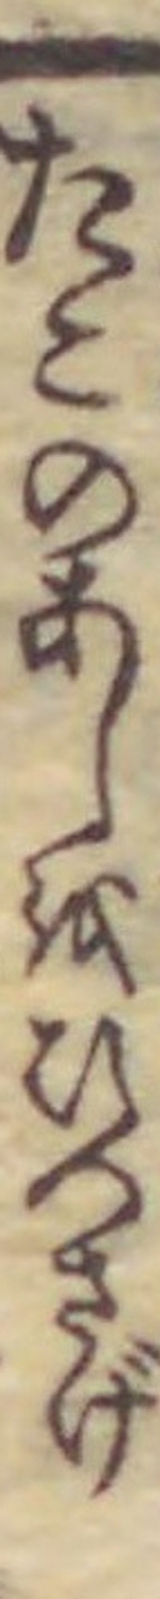たこのあしをひつさげ
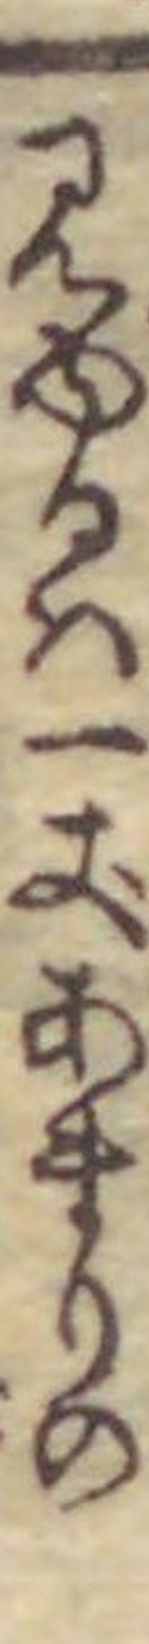見ゆるは一丈あまりの
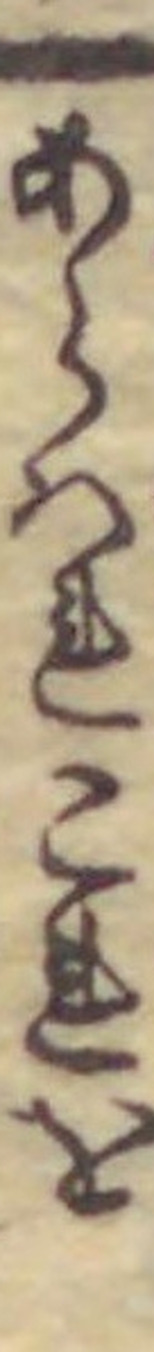あらはれこれを
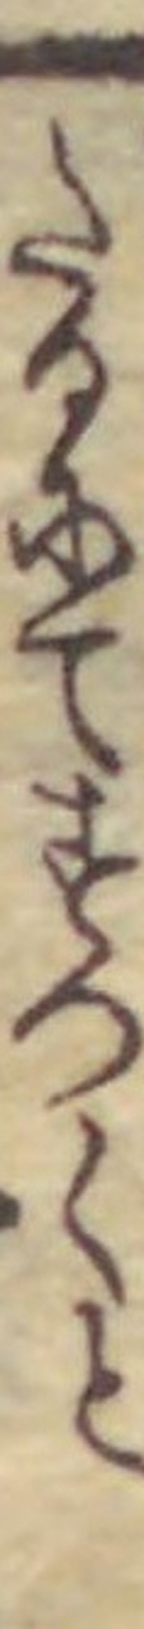たるにてすつくと
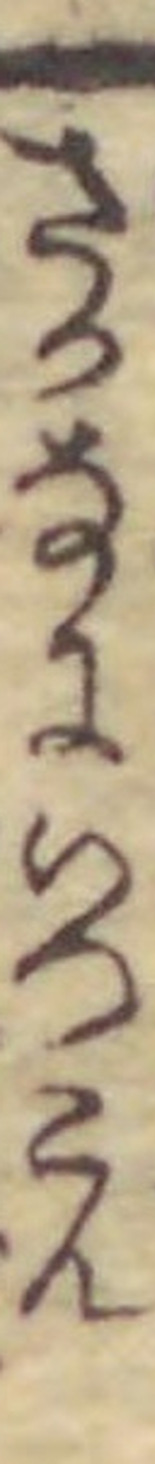さかなにいつこん
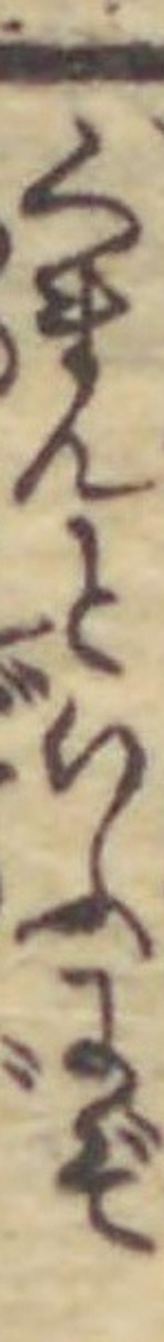くまんといふにぞ
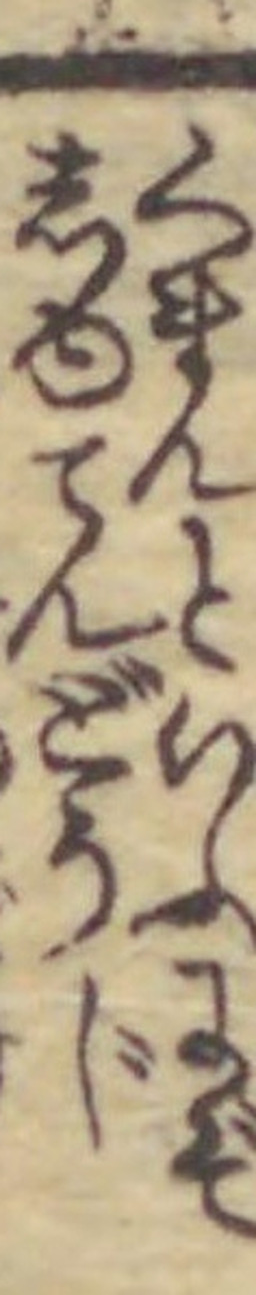しゆてんどうじ
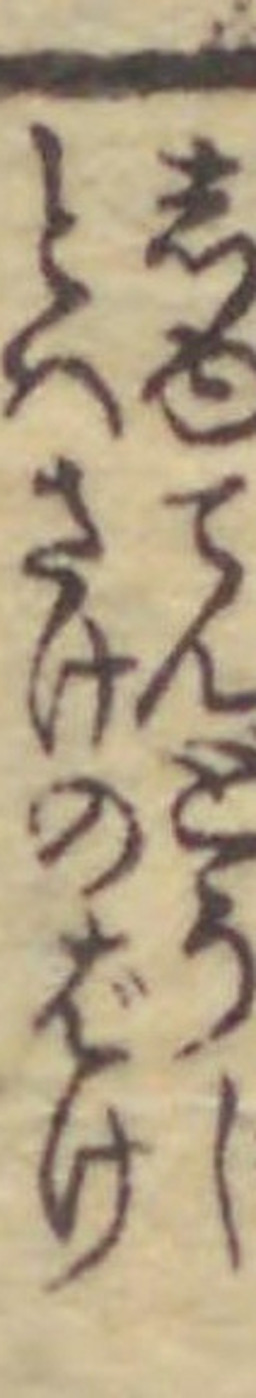とはさけのばけ
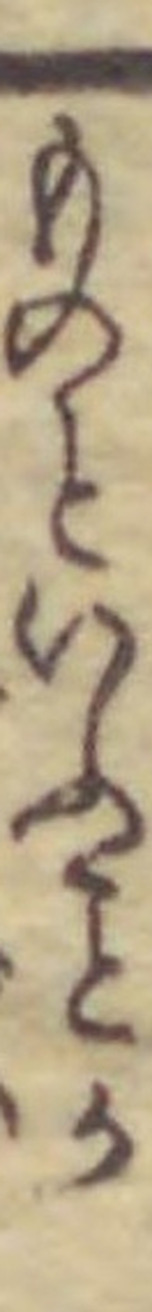ものといふことか
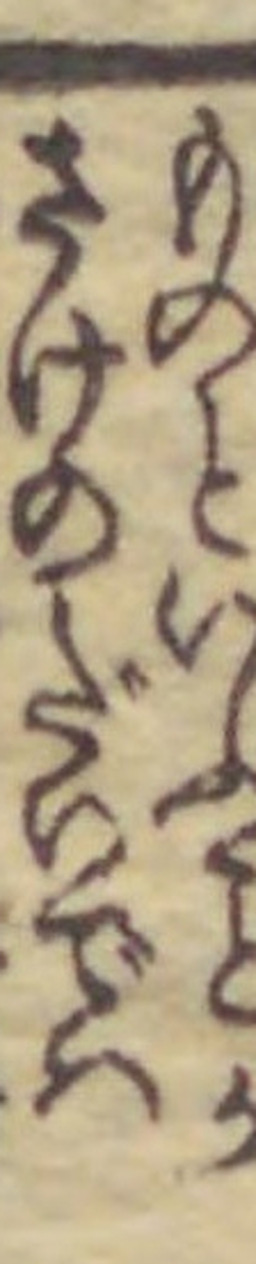さけのだいでは
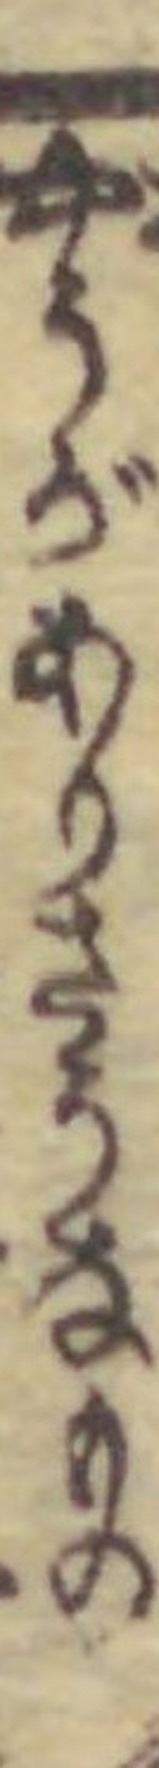やうがありさうなもの
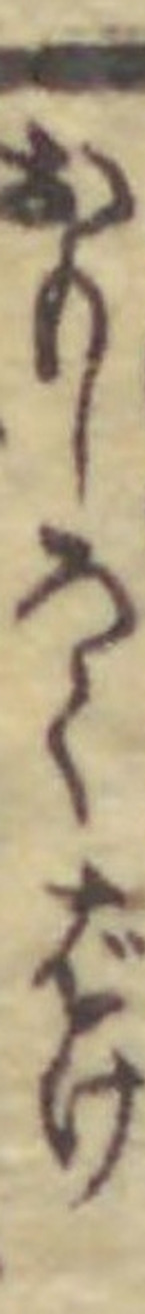おもしろくばけ
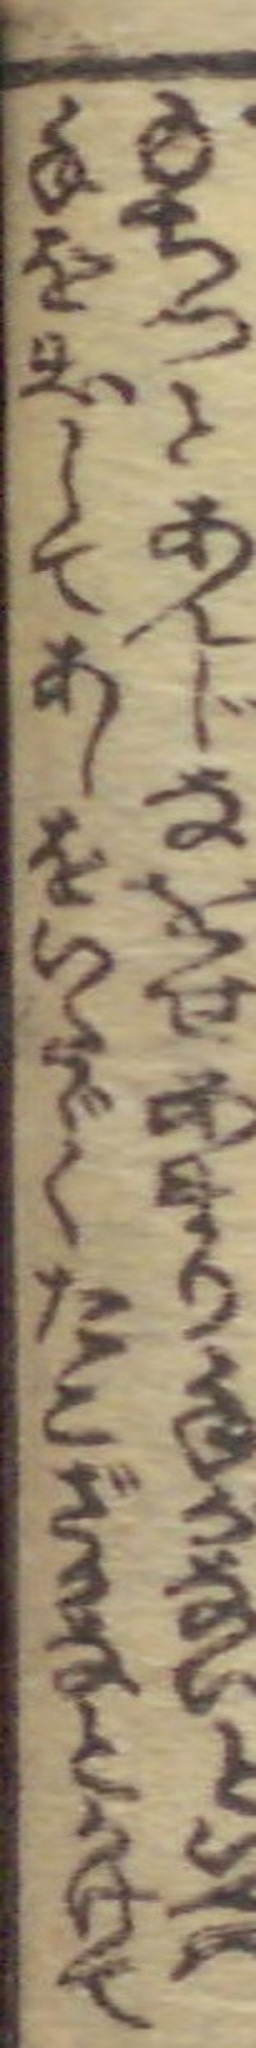手を出してあしをいたゞくたこざかなとかけて
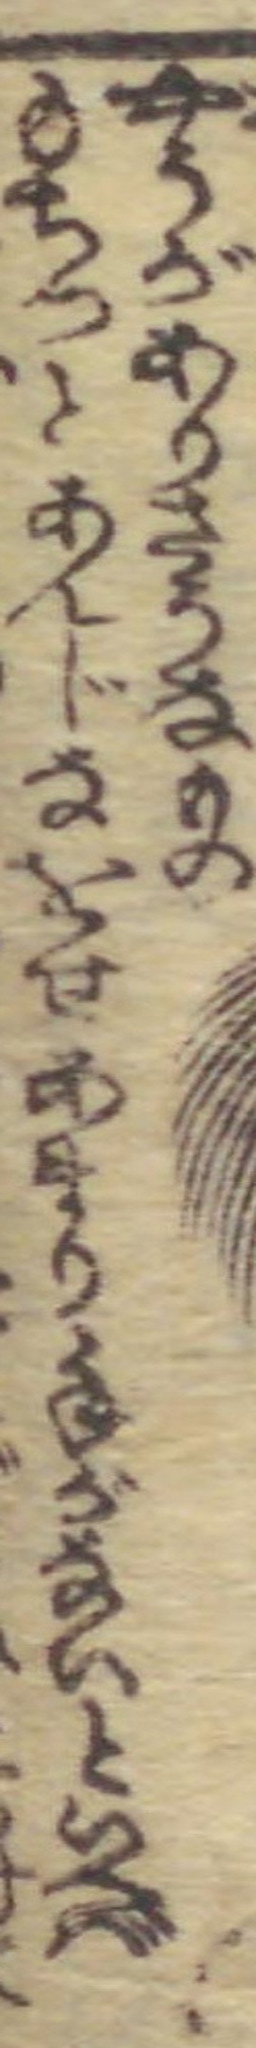もちつとあんじなをせあまり手がないといへば
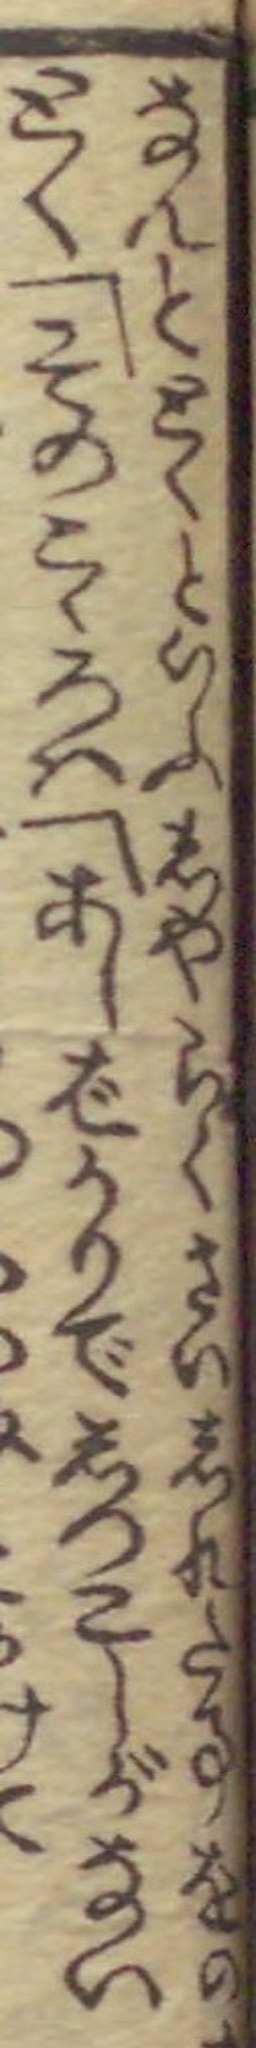とく〽そのこゝろは〽あしばかりでしつこしがない
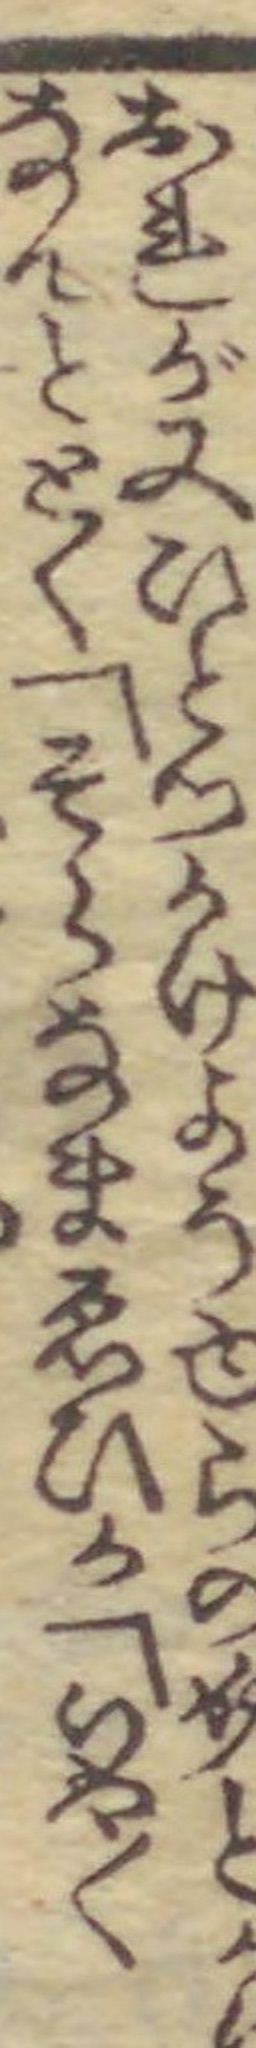なんととく〽そらなまゑひか〽いや〳〵
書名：大時代唐土化物 3巻. 曽我太夫染
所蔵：国立国会図書館 National Diet Library, JAPAN
